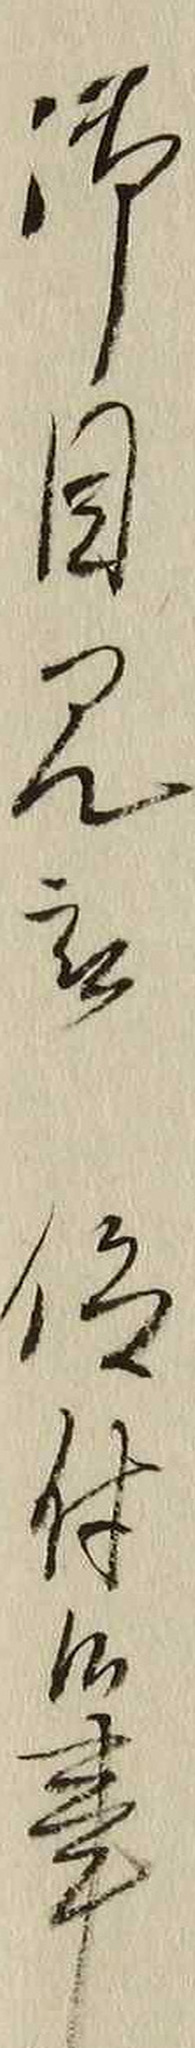御目見被仰付候事
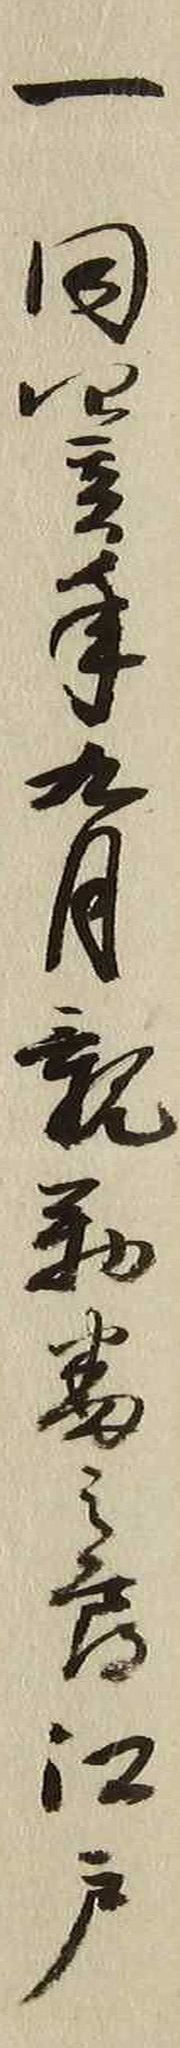一同四亥年九月親勤番之節江戸
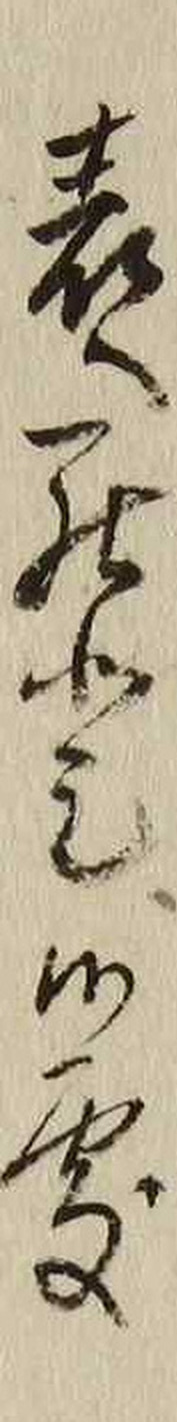表へ罷登候処
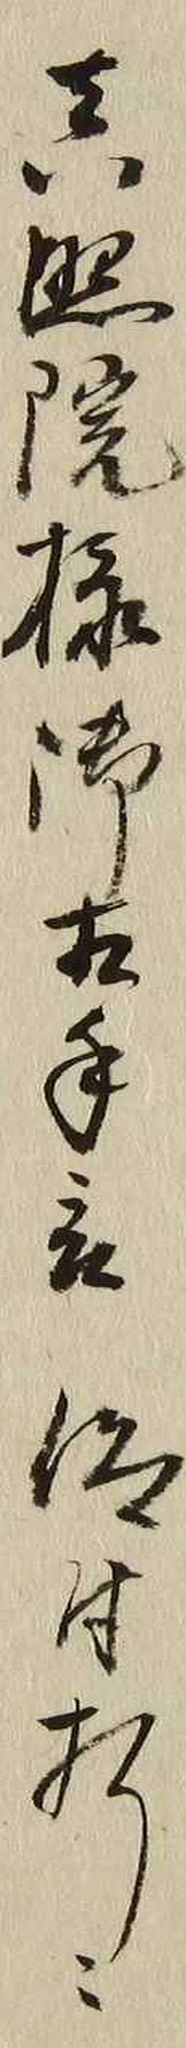真照院様御相手被仰付折々
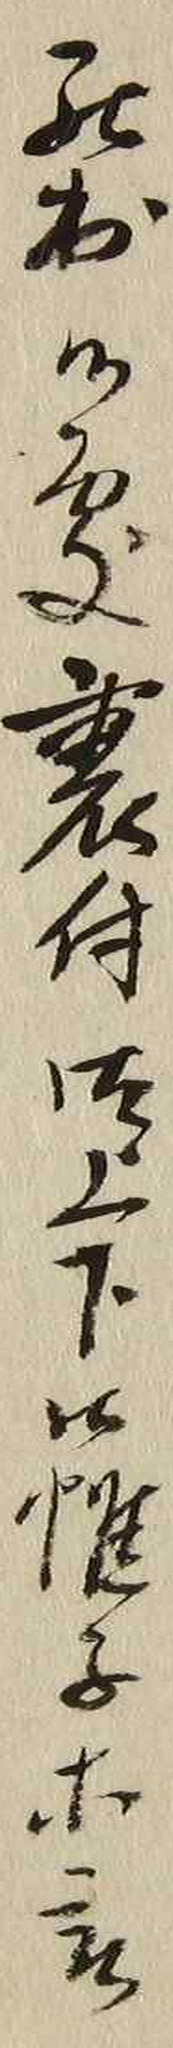罷出候処裏付御上下御帷子等被
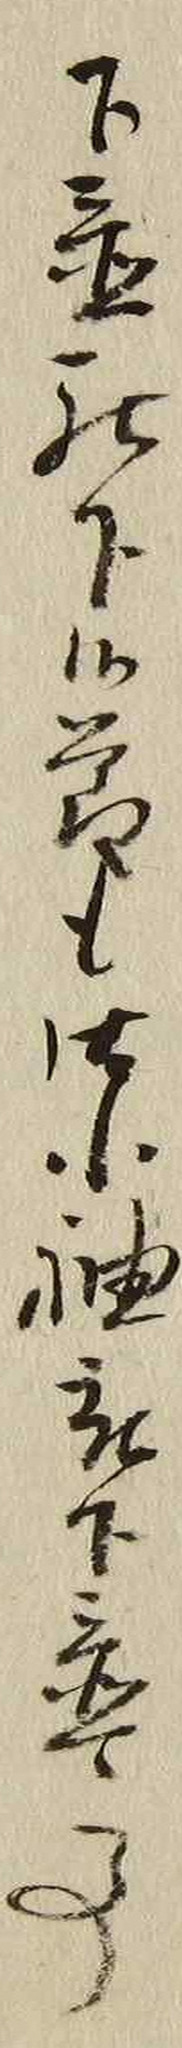下置罷下候節も御小袖被下置候事
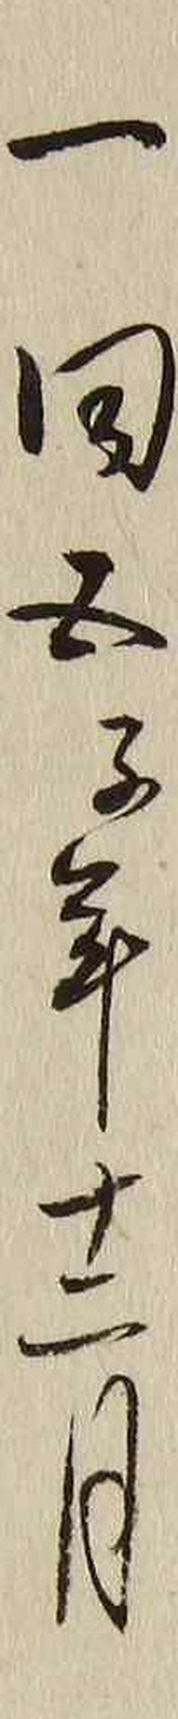一同五子年十二月
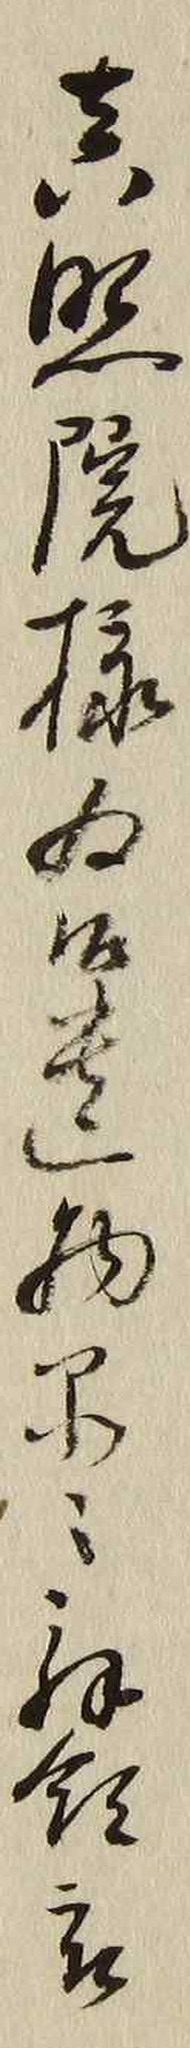真照院様為御遺物品々拝領被
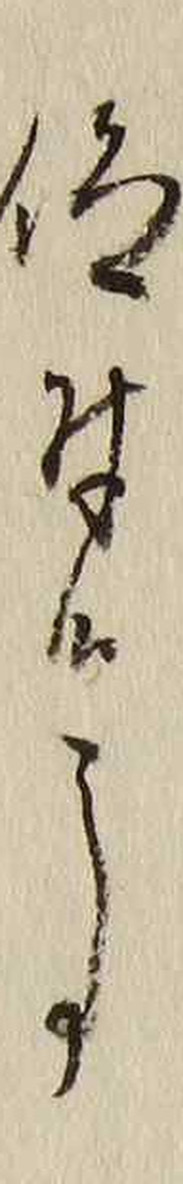仰付候事
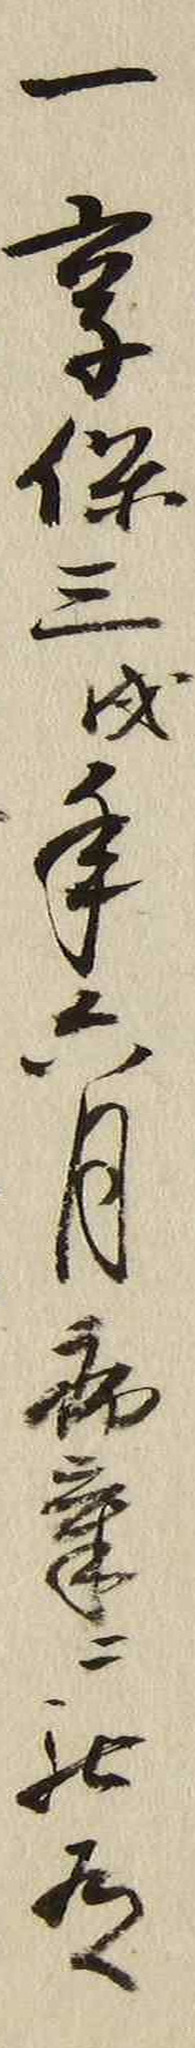一享保三戌年六月病気ニ罷有
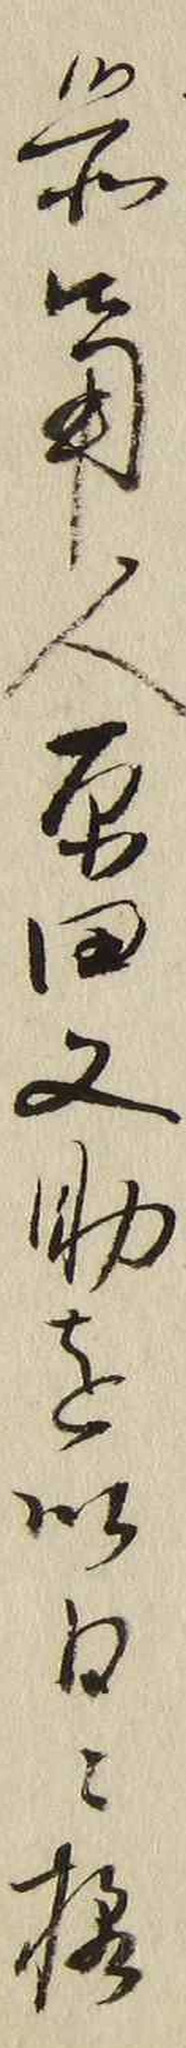候所御用人原田又助を以日々様

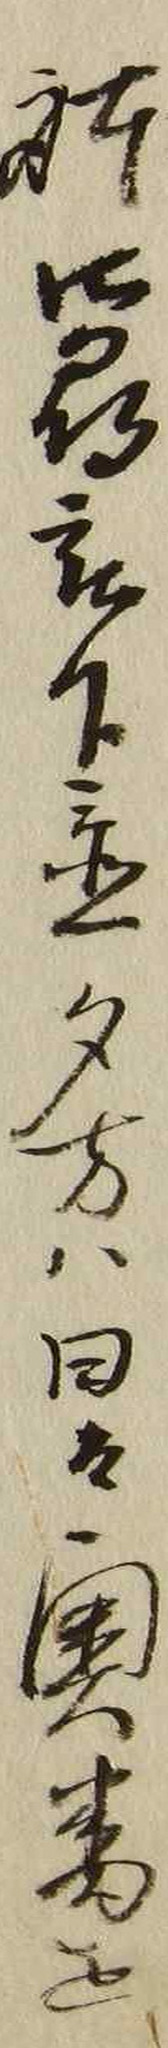体御尋被下置夕方ハ日々奥番を
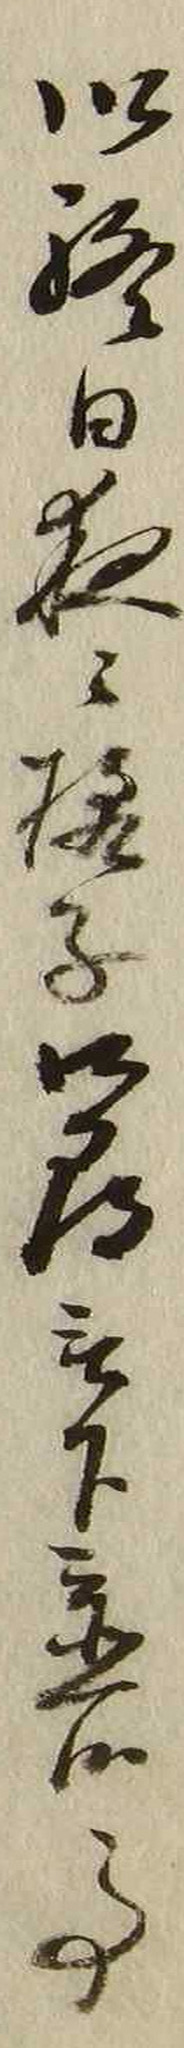以終日夜々様子御尋被下置候事
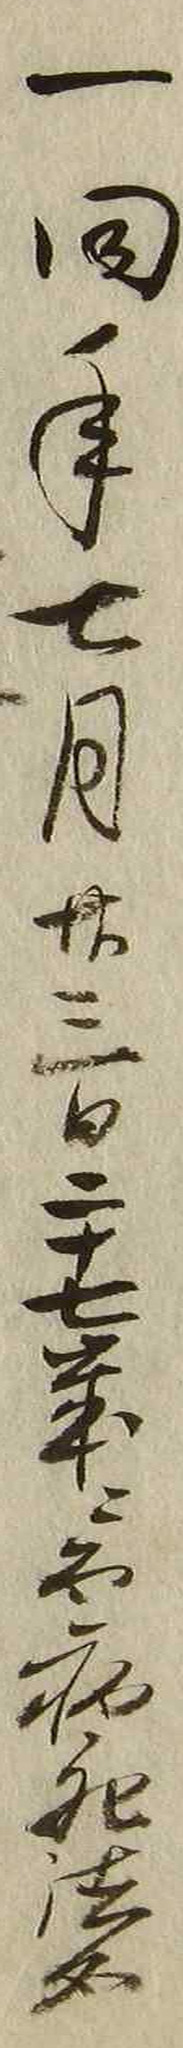一同年七月廿三日二十七歳ニ而病死法名
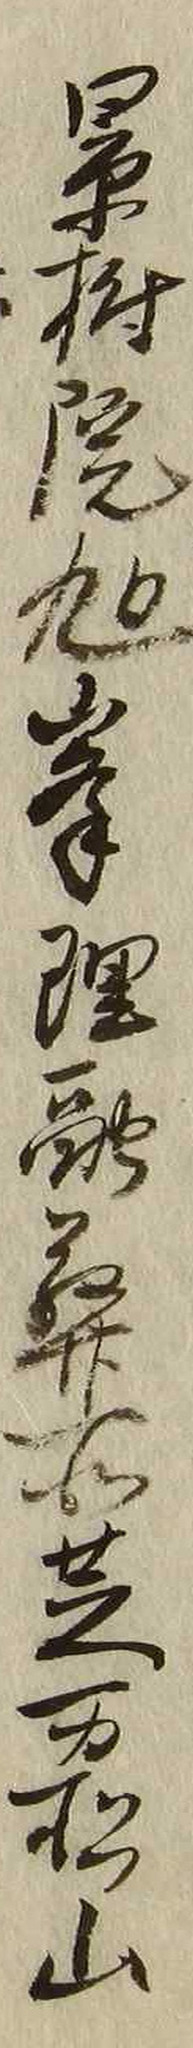景樹院旭峰理融葬所芝万松山
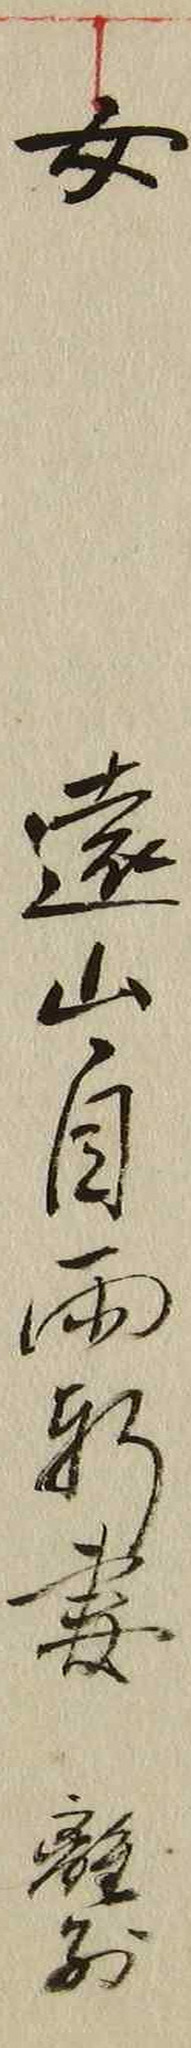女遠山自雨軒妻離別
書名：諸士系譜　巻之351　す之部1
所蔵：会津若松市立会津図書館
